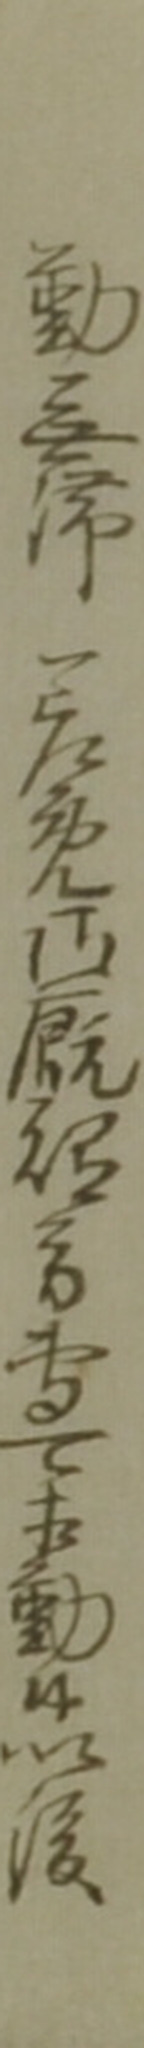勤無滞差免御厩賄方専可相勤候以後
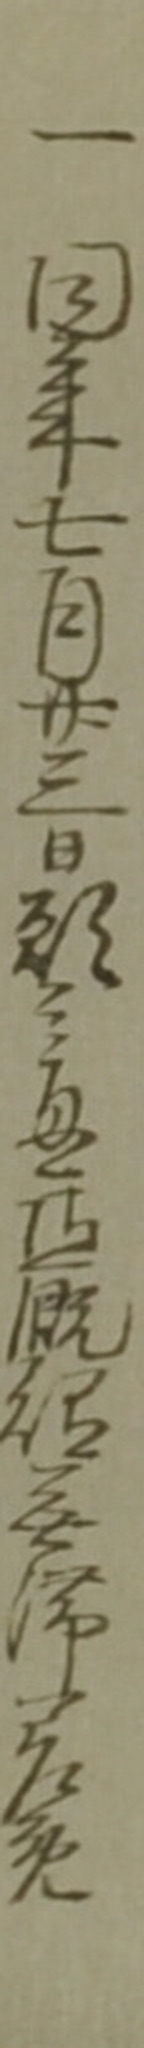一同年七月廿三日願之通御厩賄無滞差免
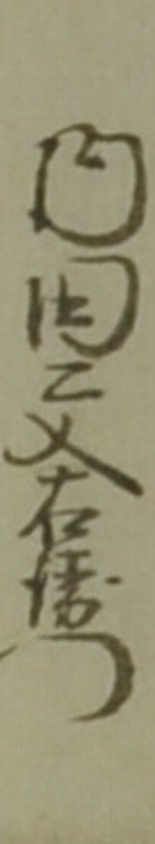内田文右衛門

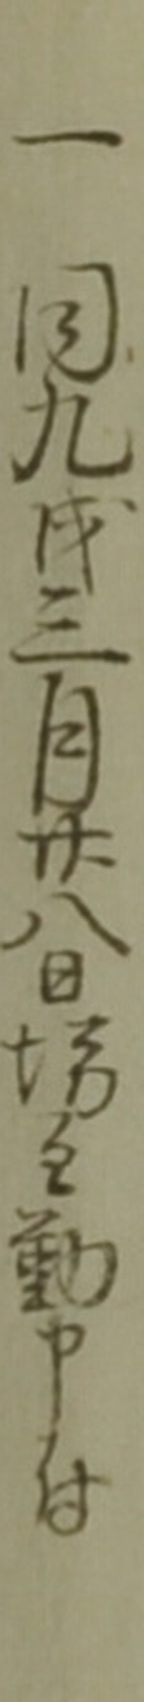一同九戌三月廿八日坊主勤申付
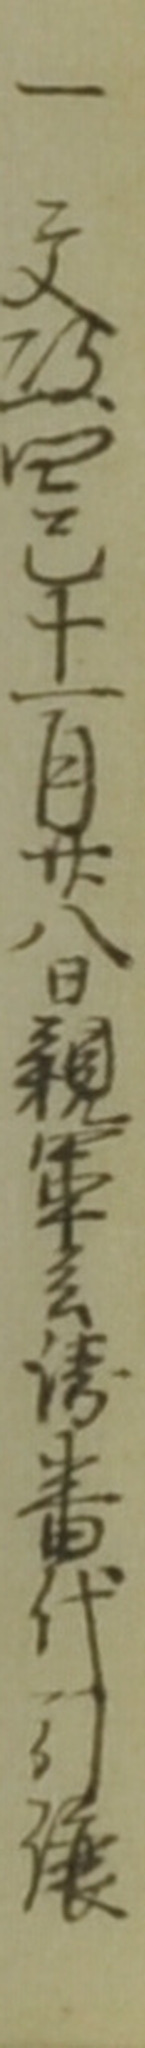一文政四巳十一月廿八日親軍兵衛番代引譲
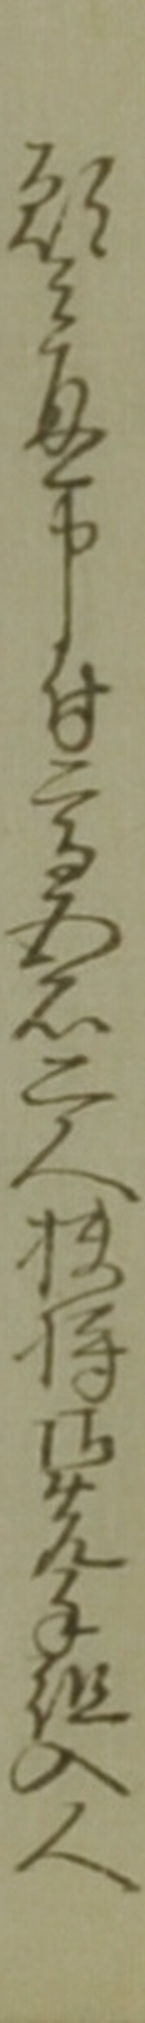願之通申付高五石二人扶持御先手組入人
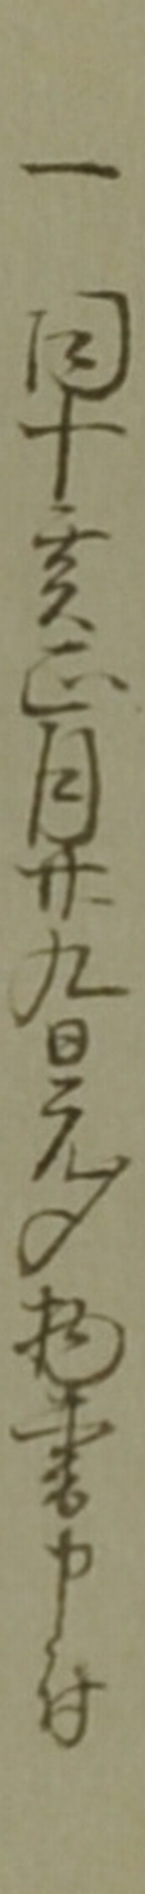一同十亥正月廿九日元〆物書申付
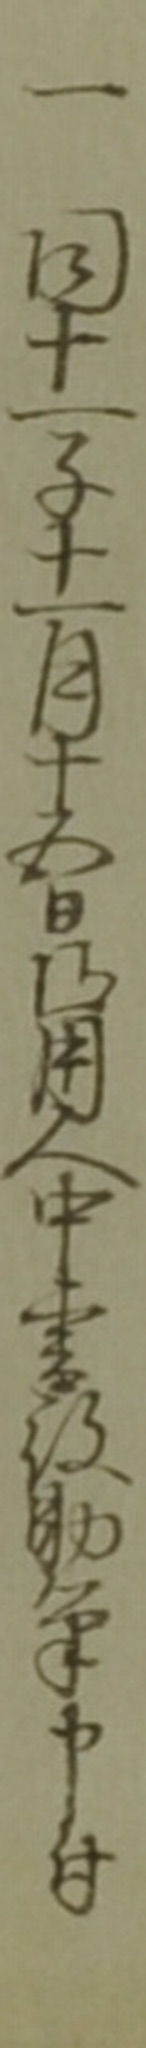一同十一子十一月十五日御用人中書役助筆申付
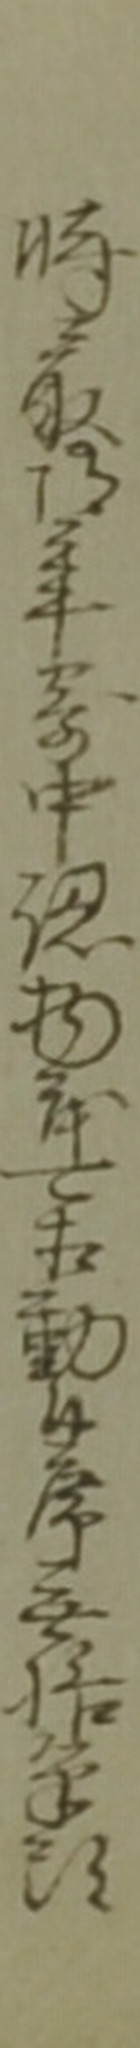時ニ取御年寄中認物茂可相勤候席無格筆頭
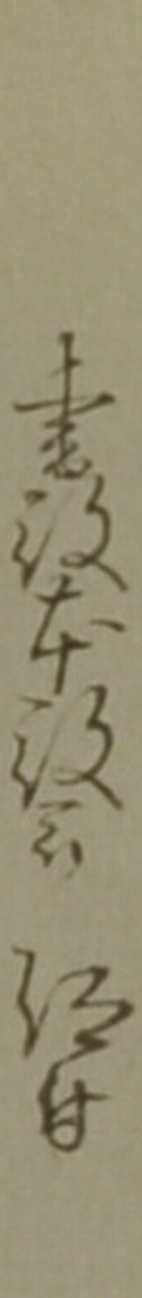書役本役被仰付
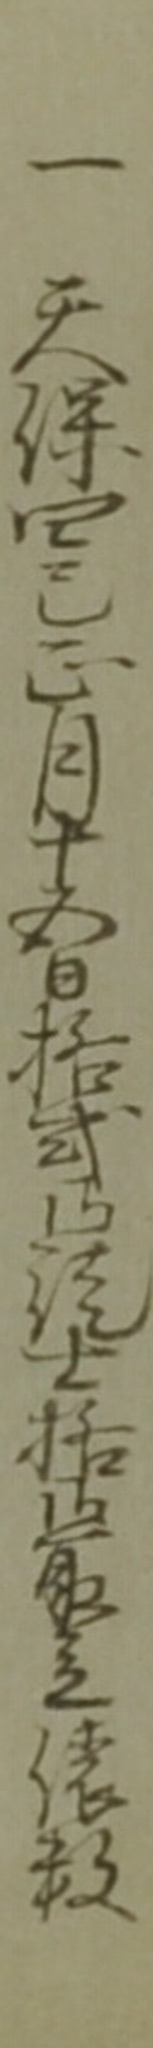一天保四巳正月十五日格式御徒士格御取立俵数
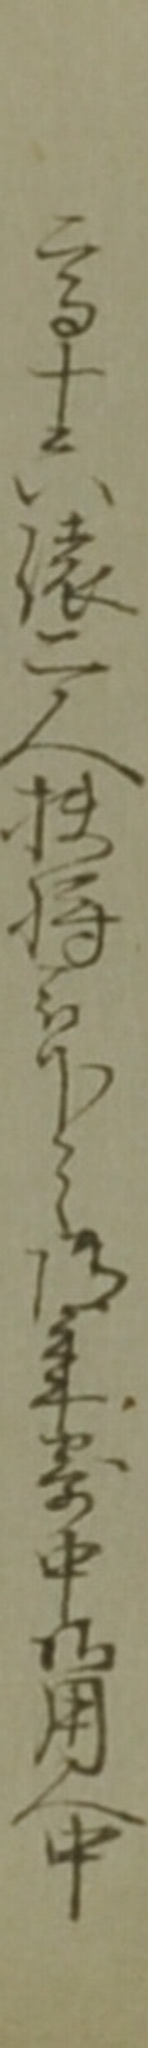高十六俵二人扶持被下之御年寄中御用人中
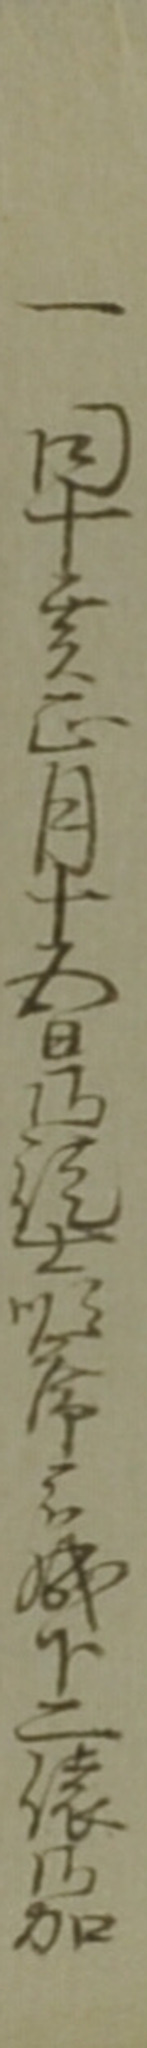一同十亥正月十五日御徒士順席被成下二俵御加
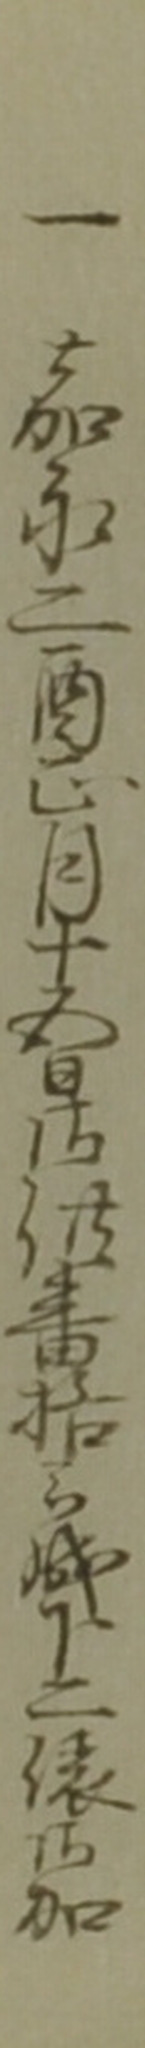一嘉永二酉正月十五日御供書格被成下二俵御加
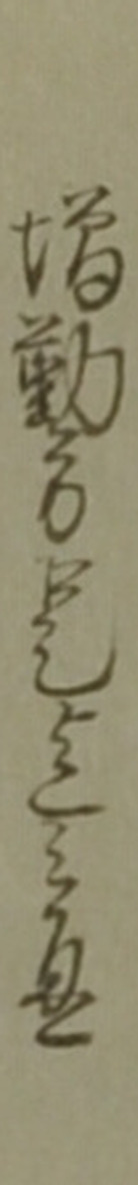増勤方是迄之通

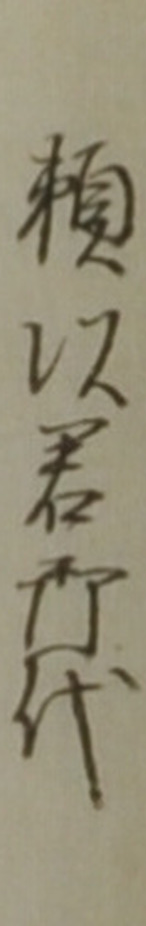頼以君御代
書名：無足諸士勤仕録（七）
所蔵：伊那市立高遠町図書館・合同会社AMANE
